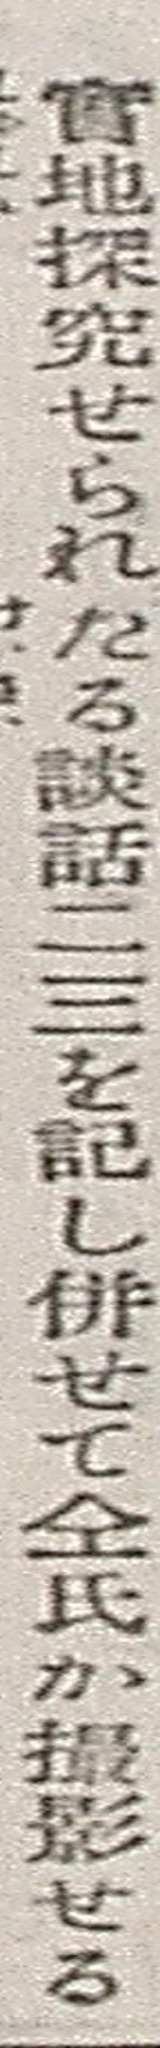実地探究せられたる談話二三を記し併せて仝氏か撮影せる
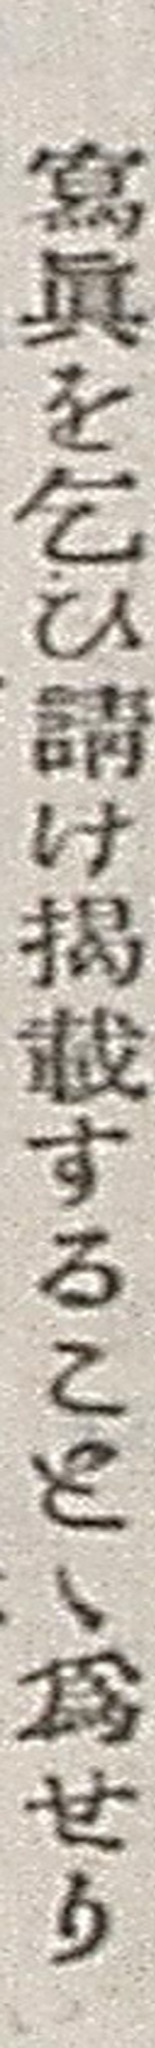写真を乞ひ請け掲載することゝ為せり
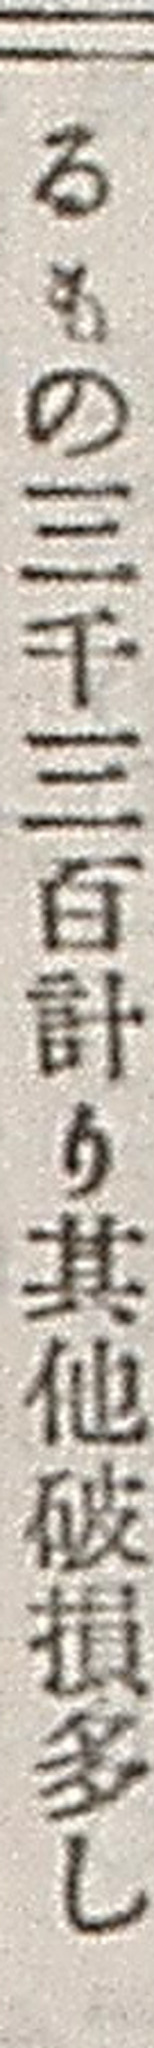るもの三千三百計り其他破損多し
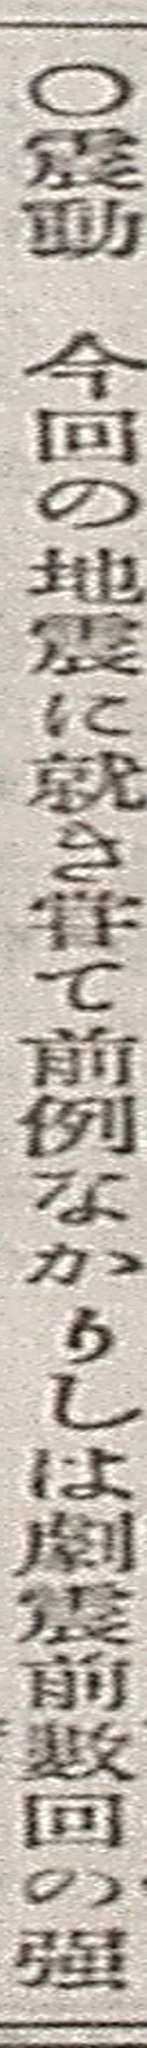〇震動今回の地震に就き嘗て前例なかりしは劇震前数回の強
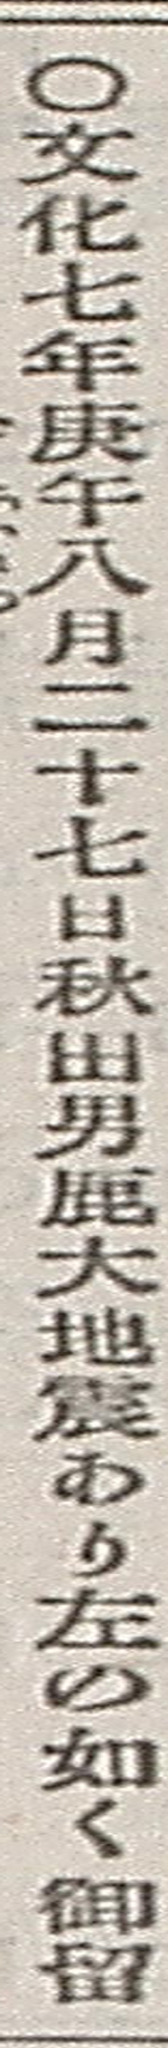〇文化七年庚午八月ニ十七日秋田男鹿大地震あり左の如く御留
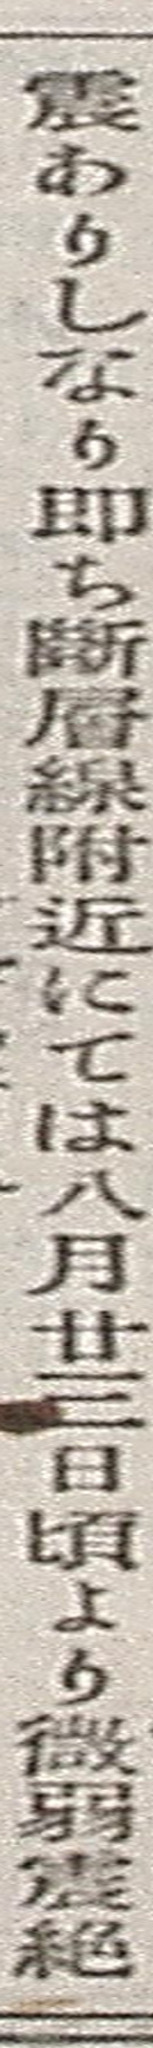震ありしなり即ち断層線附近にては八月廿三日頃より微弱震絶
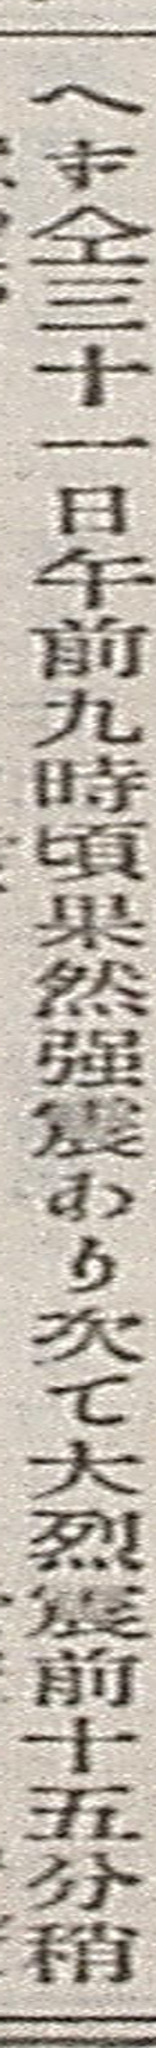へず仝三十一日午前九時頃果然強震あり次て大烈震前十五分稍
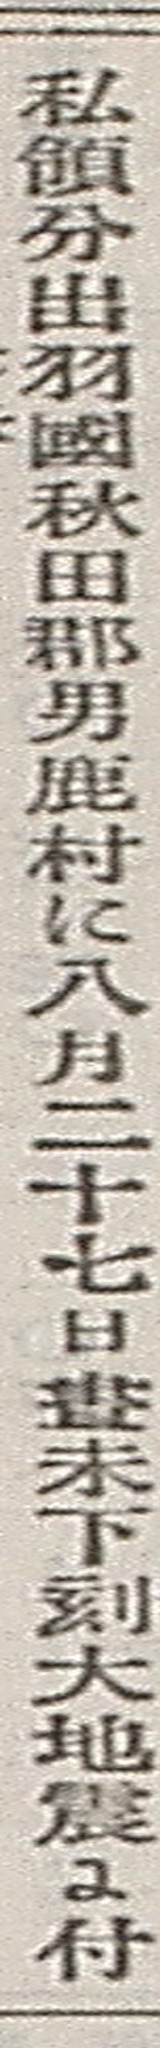私領分出羽国秋田郡男鹿村に八月二十七日昼未下刻大地震に付
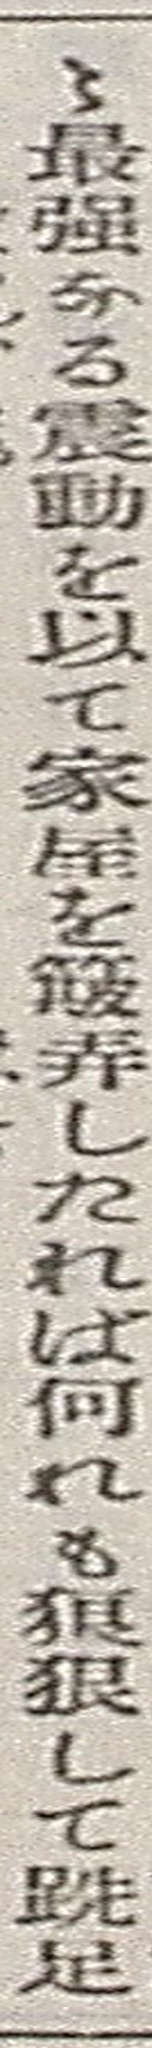々最強なる震動を以て家屋を簸弄したれば何れも狼狽して跣足
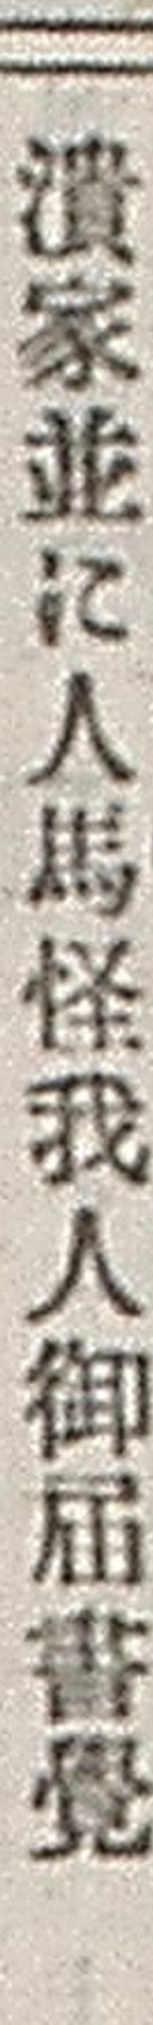潰家並に人馬怪我人御届書覚
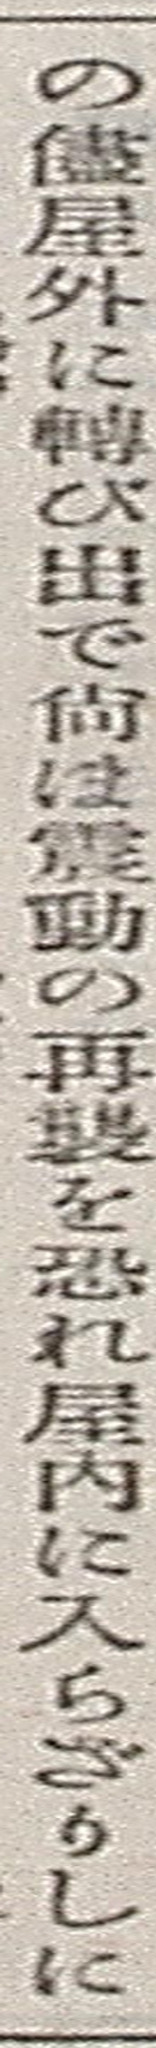の儘屋外に転び出で尚ほ震動の再襲を恐れ屋内に入らざりしに
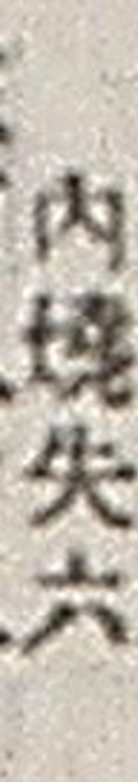内焼失六
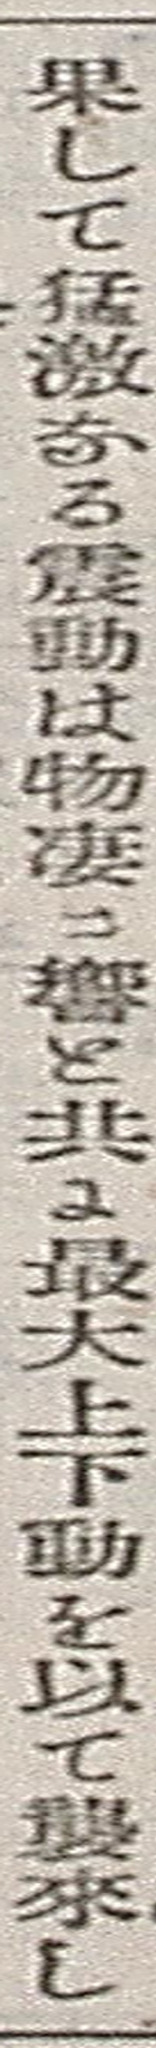果して猛激なる震動は物凄き響と共に最大上下動を以て襲来し
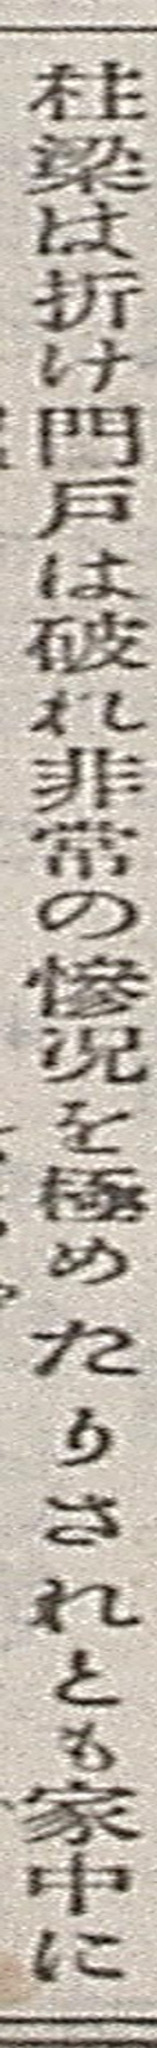柱梁は折け門戸は破れ非常の惨況を極めたりされとも家中に
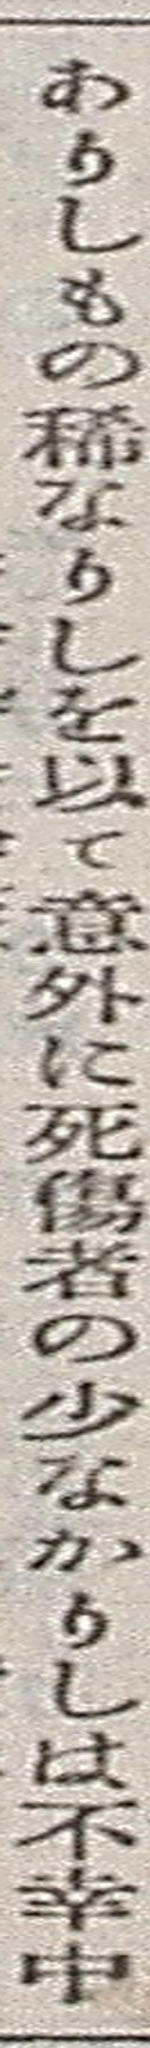ありしもの稀なりしを以て意外に死傷者の少なかりしは不幸中
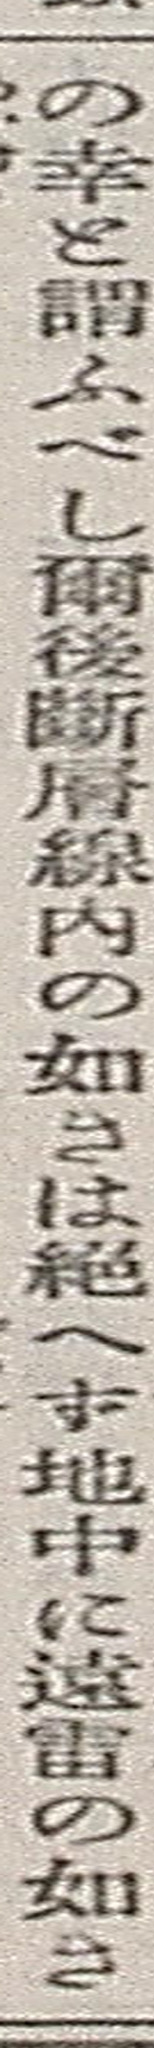の幸と謂ふべし爾後断層線内の如きは絶へず地中に遠雷の如き
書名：風俗畫報臨時増刊第百二十四號　洪水地震被害録（上）
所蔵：東京大学地震研究所図書室 Earthquake Research Institute Library, The University of Tokyo, JAPAN
